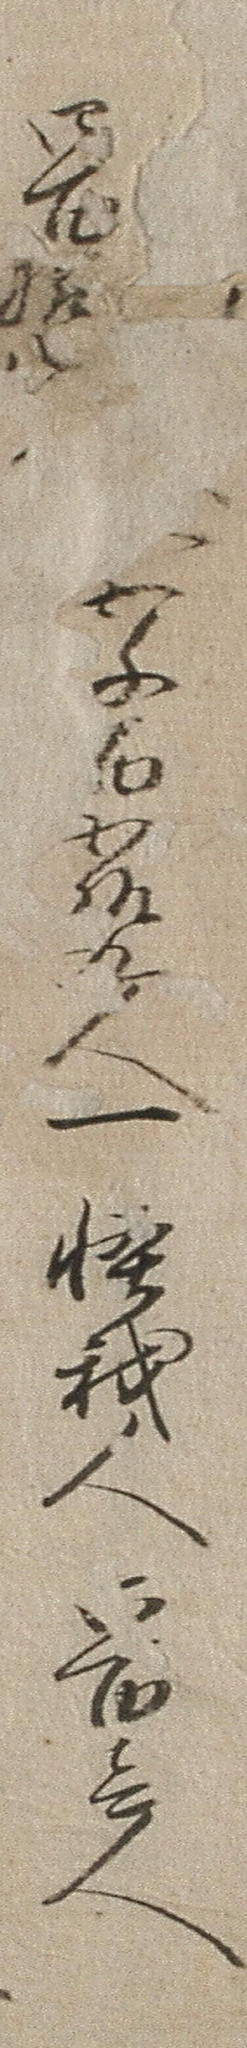四百拾八五千百五拾九人一怪我人百壱人
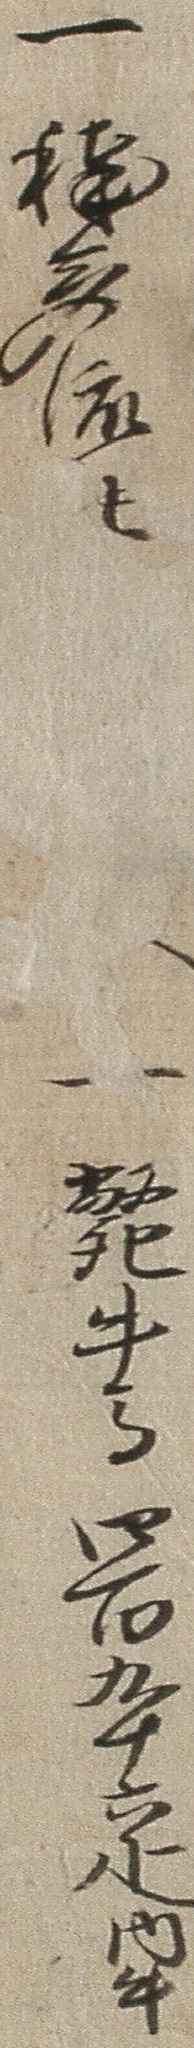一穢多流失人一弊牛馬四百九十六疋内牛
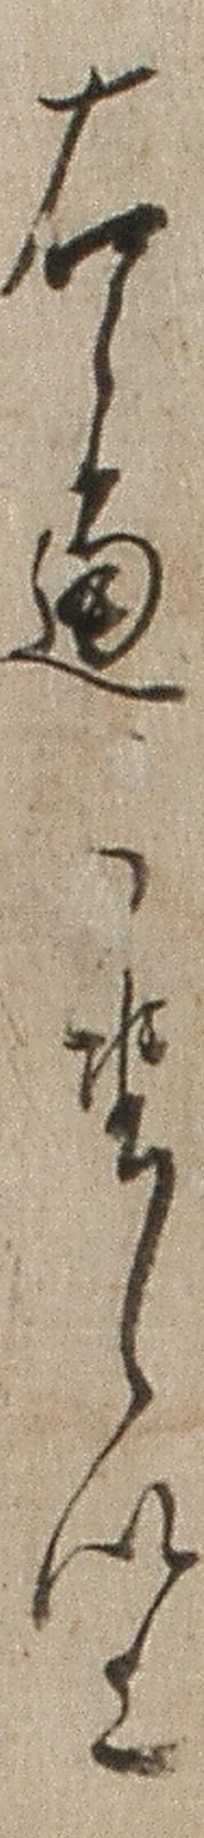右之通に御座候以上
